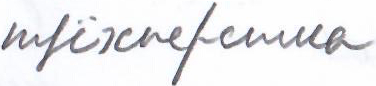трёхперстка
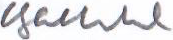цапля
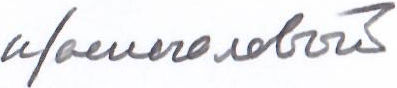красноголовый
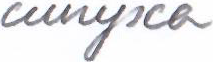сипуха
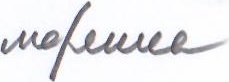морянка
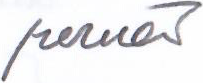речной
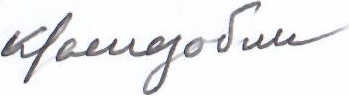краснозобик
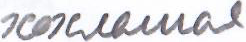хохлатая
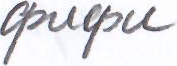фифи
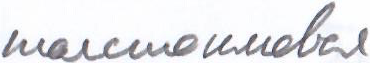толстоклювая
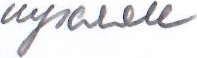пухляк
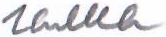галка
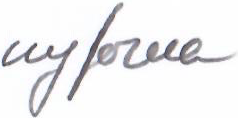курочка
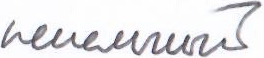пепельный
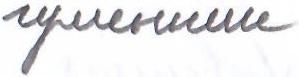гуменник
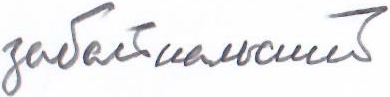забайкальский
